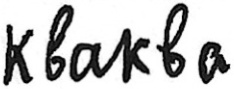кваква
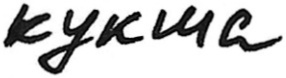кукша
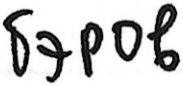бэров
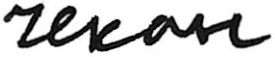чекан
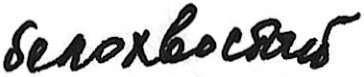белохвостый
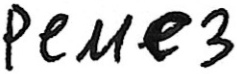ремез
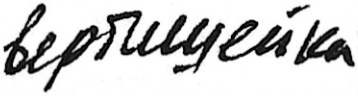вертишейка
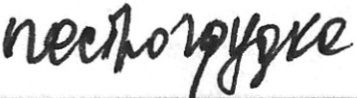пестрогрудка
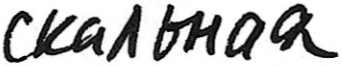скальная
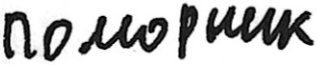поморник
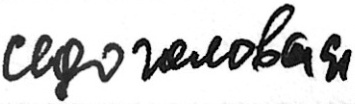седогаловая
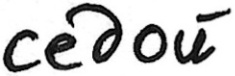седой
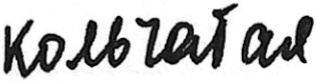кольчатая
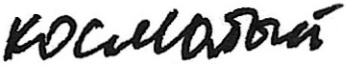косматый
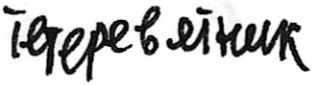тетеревятник
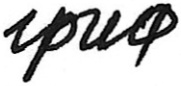гриф
